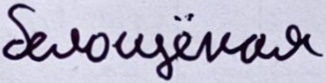белощёкая
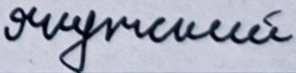якутский
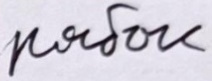рябок
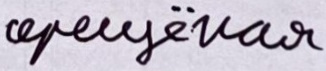серещёкая
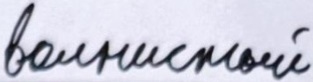волнистый
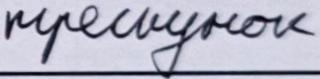трескунок
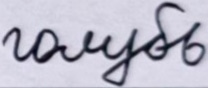голубь
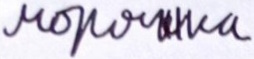морянка
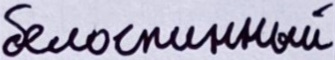белоспинный
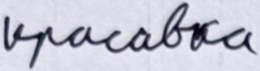красавка
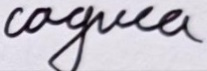саджа
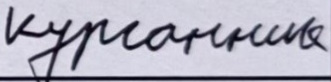курганник
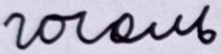гоголь
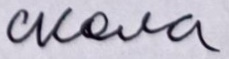скола
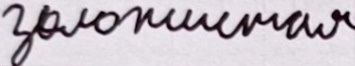золотистая
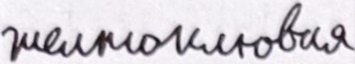желтоклювая
